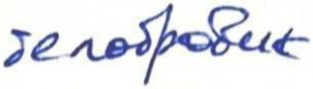белобровик
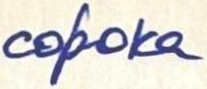сорока
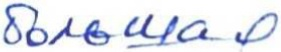большая
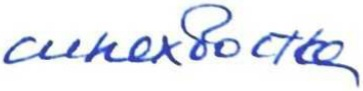синехвостка
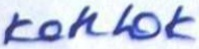конюк
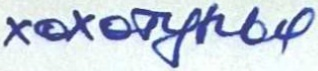хохотунья
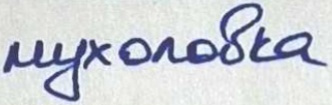мухоловка
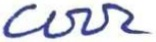сыч
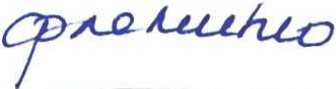фломинго
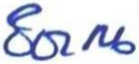выпь
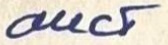аист
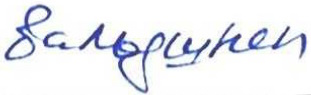вальдшнеп
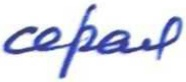серая
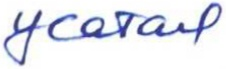усатая
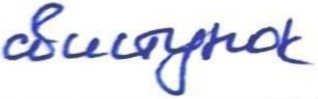свистунок
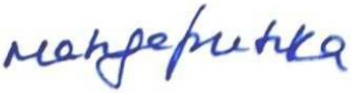мандеринка
